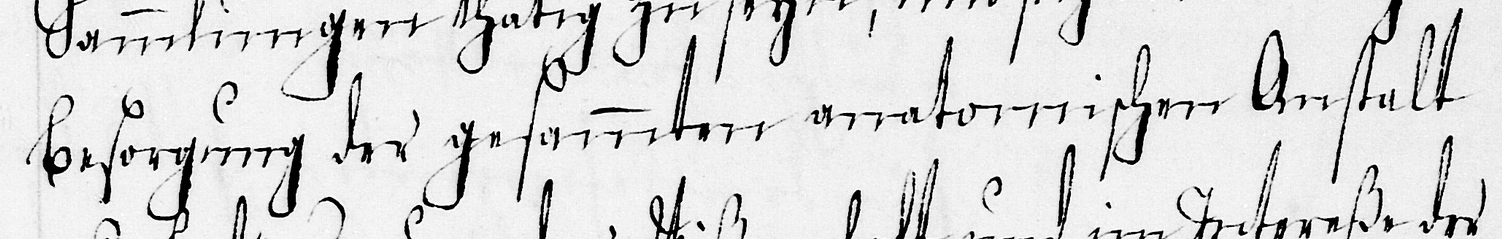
Besorgung der gesammten anatomischen Anstalt
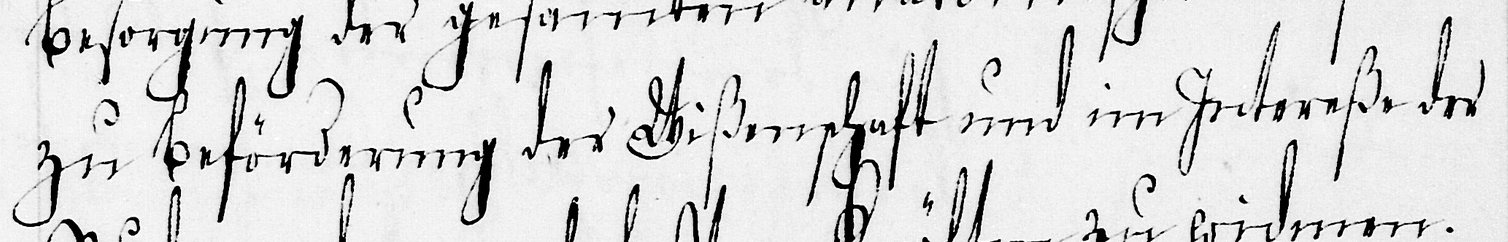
zu Beförderung der Wißenschaft und im Intereße der
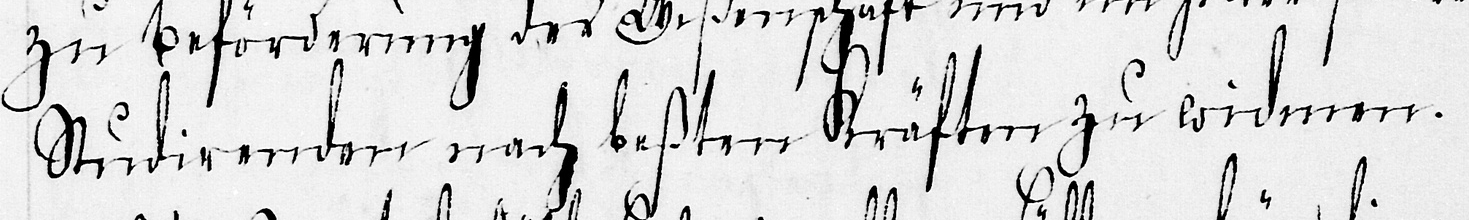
Studirenden nach beßten Kräften zu widmen.
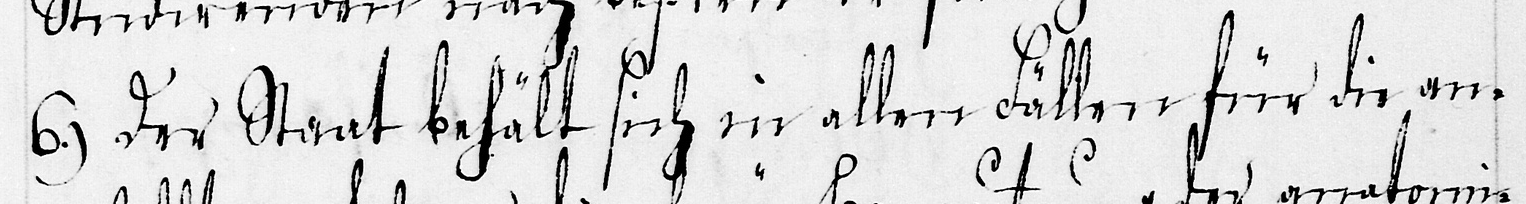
6.) Der Staat behält sich in allen Fällen für die an¬
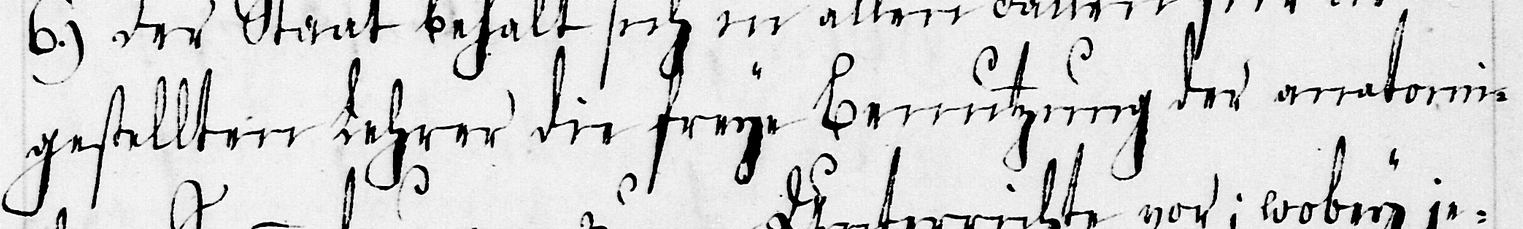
gestellten Lehrer die freye Benutzung der anatomi¬
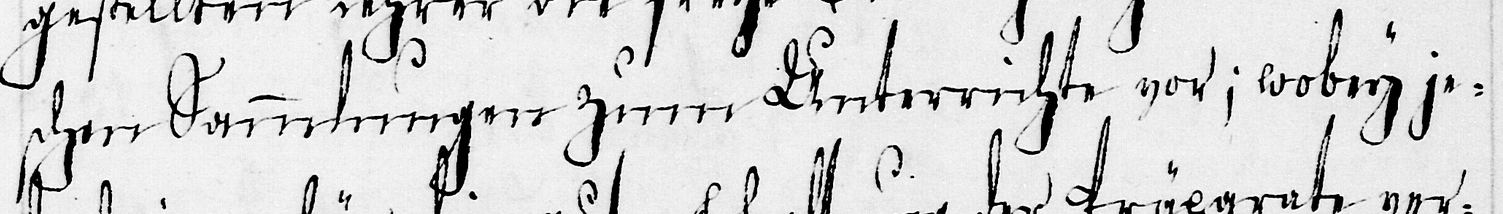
schen Sammlungen zum Unterrichte vor; wobey je¬
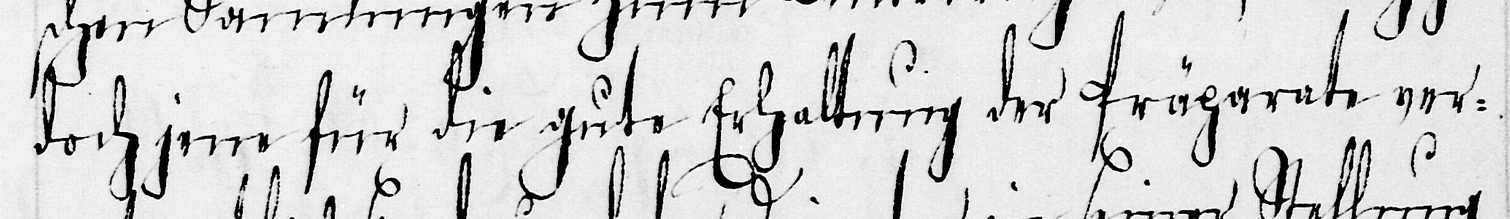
doch jene für die gute Erhaltung der Präparate ver¬
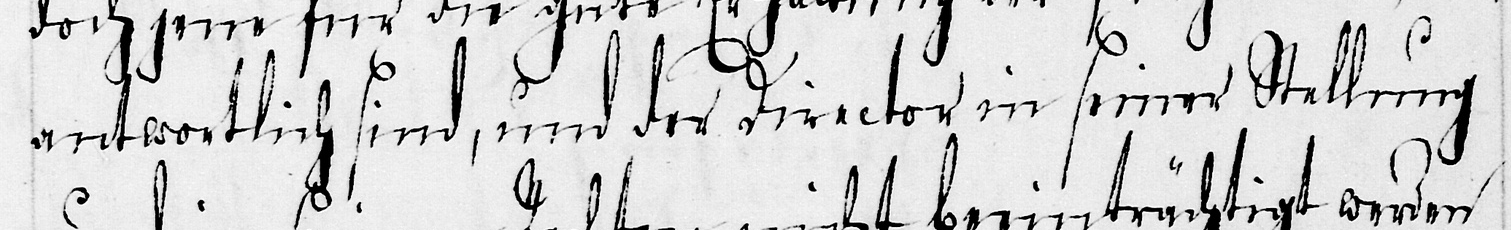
antwortlich sind, und der Director in seiner Stellung
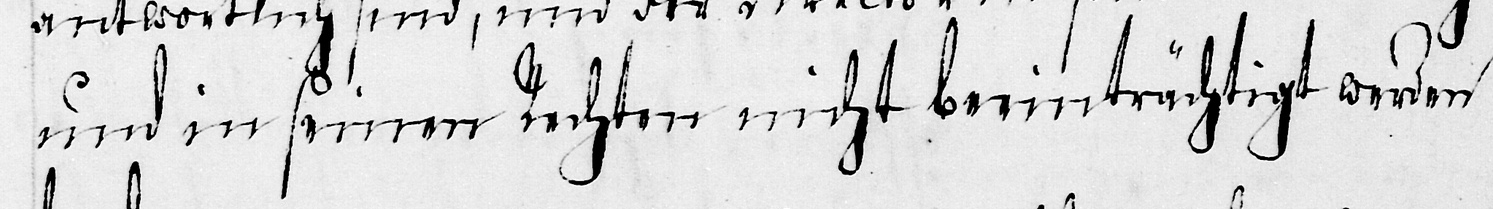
und in seinen Rechten nicht beeinträchtigt werden
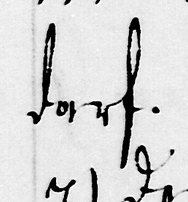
rf.
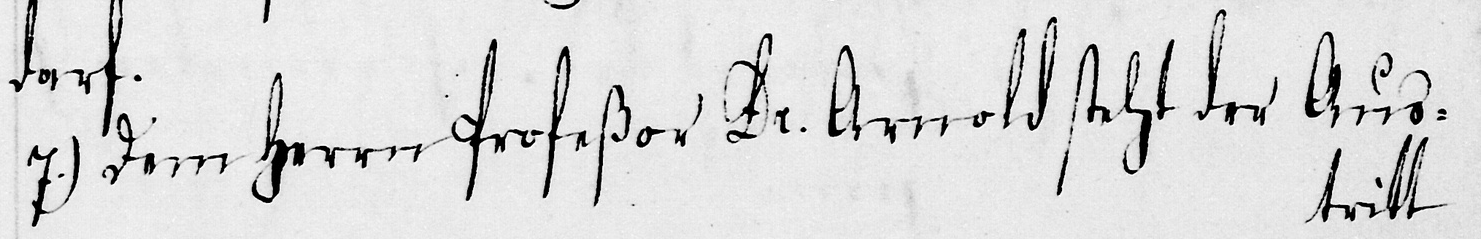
7.) Dem Herrn Profeßor Dr. Arnold steht der Aus-
